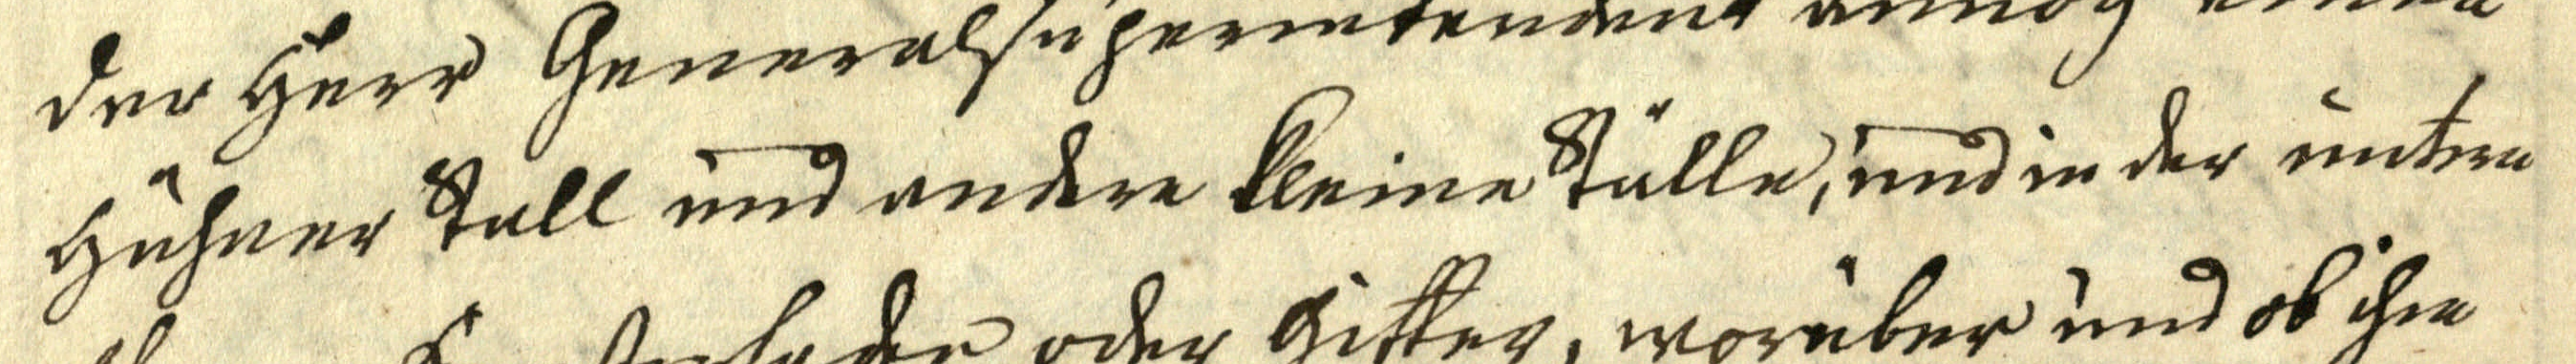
Hühner Stall und andere kleine Ställe, und in der untern
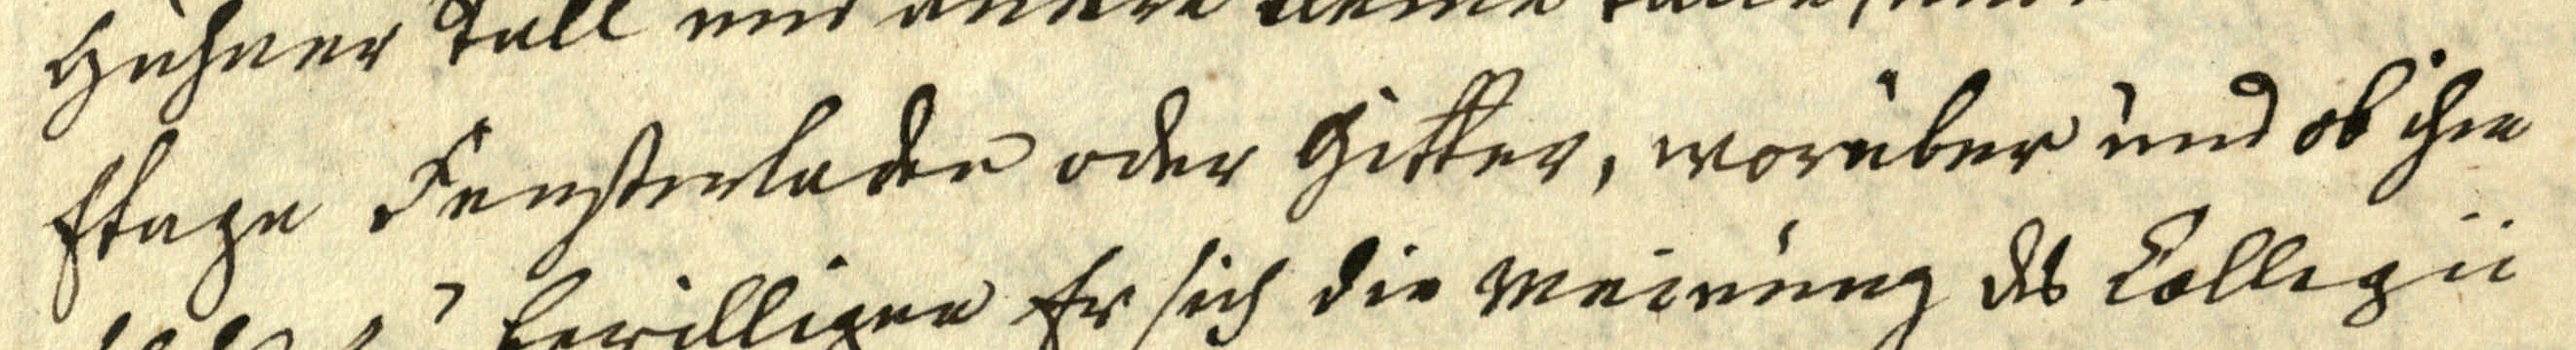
Etage Fensterladen oder Gitter, worüber und ob ihm
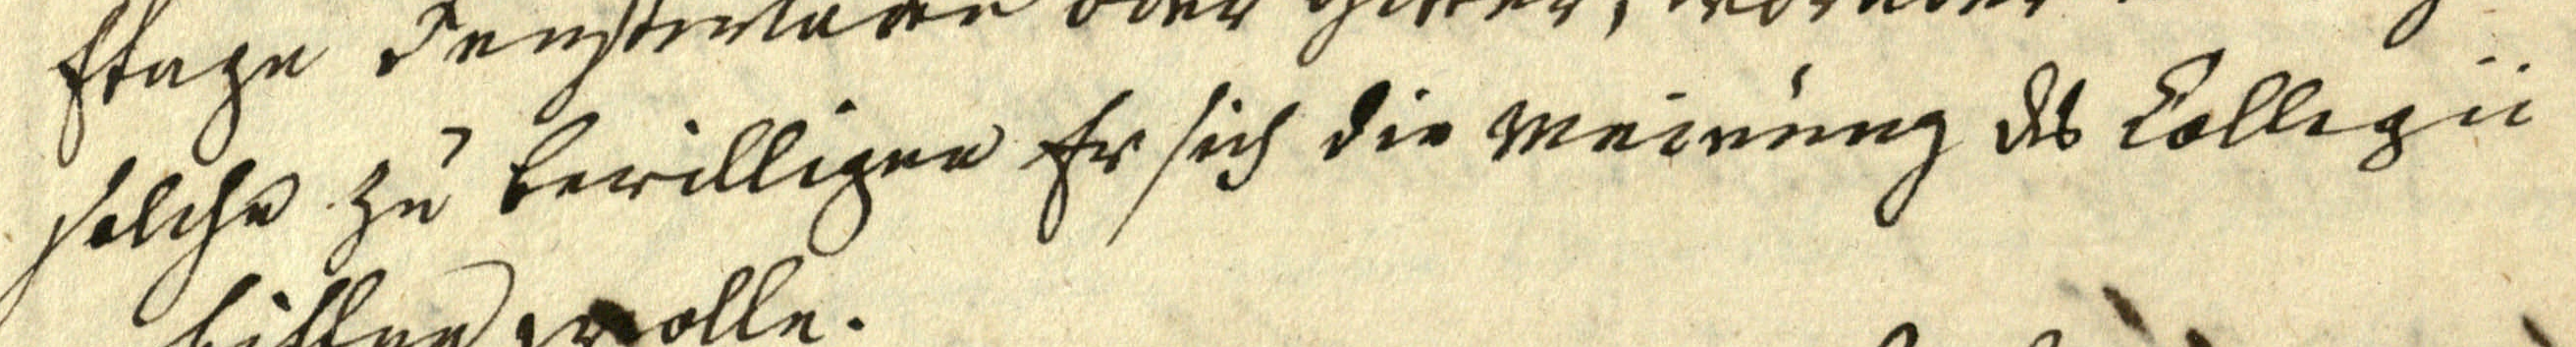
solche zu bewilligen Er sich die Meinung des Collegii
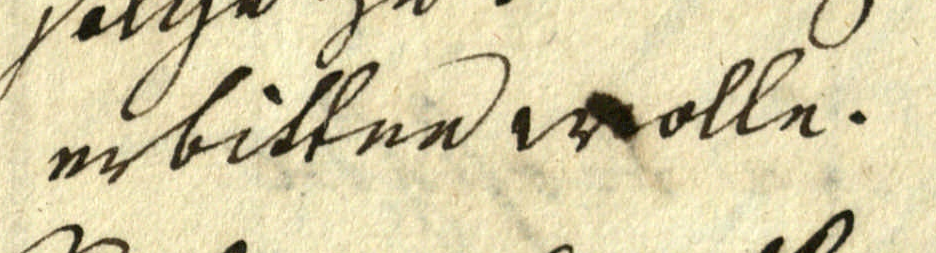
erbitten wolle.
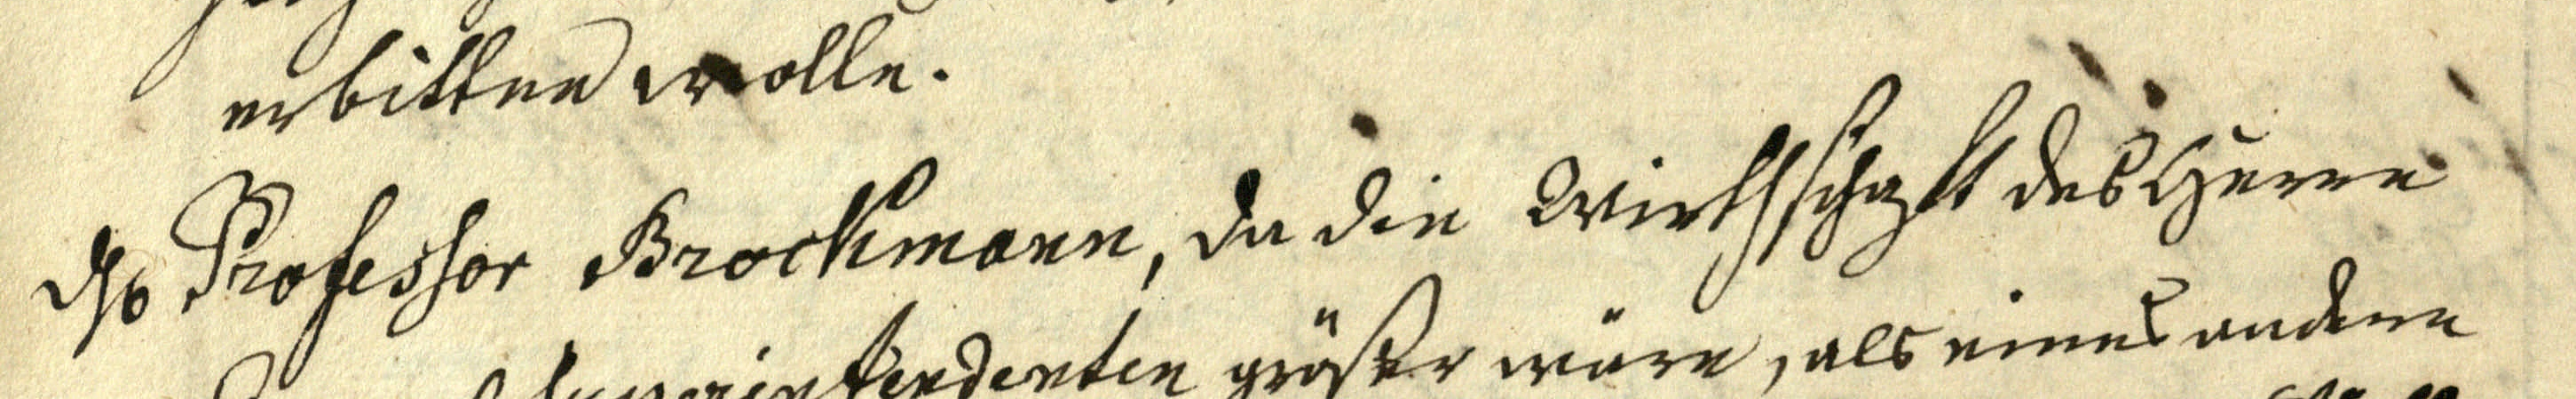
dh Professor Brockmann, da die Wirthschaft des Herrn
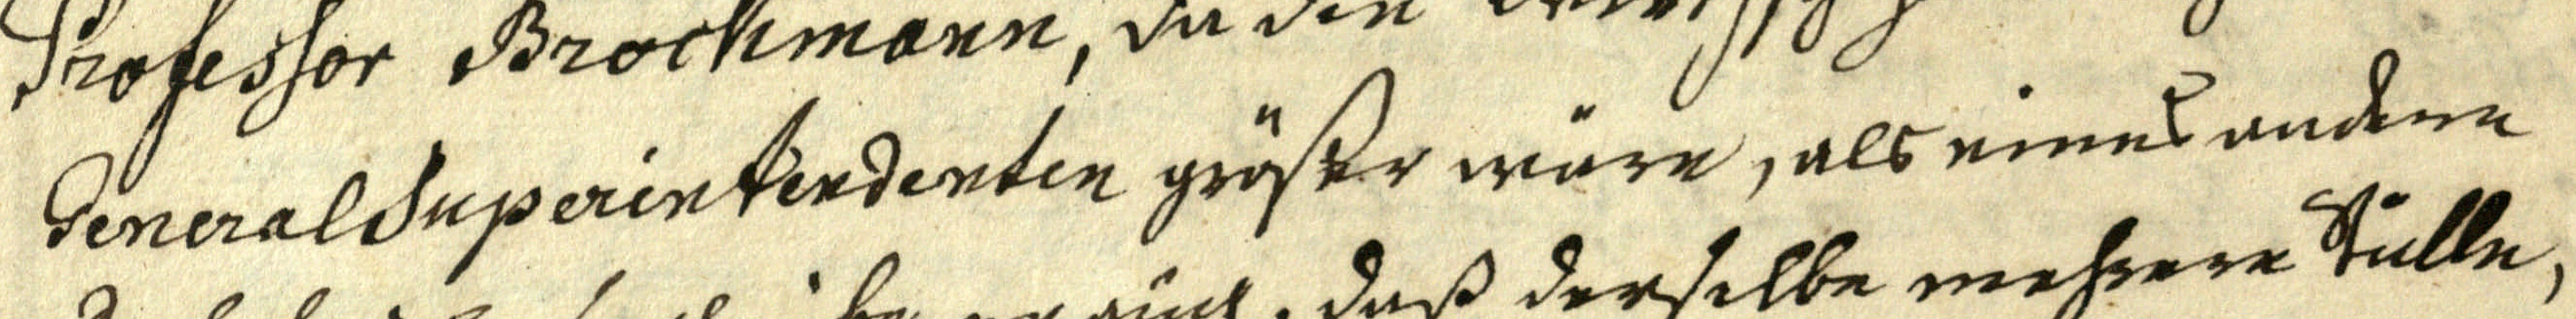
GeneralSuperintendenten größer wäre, als eines andern
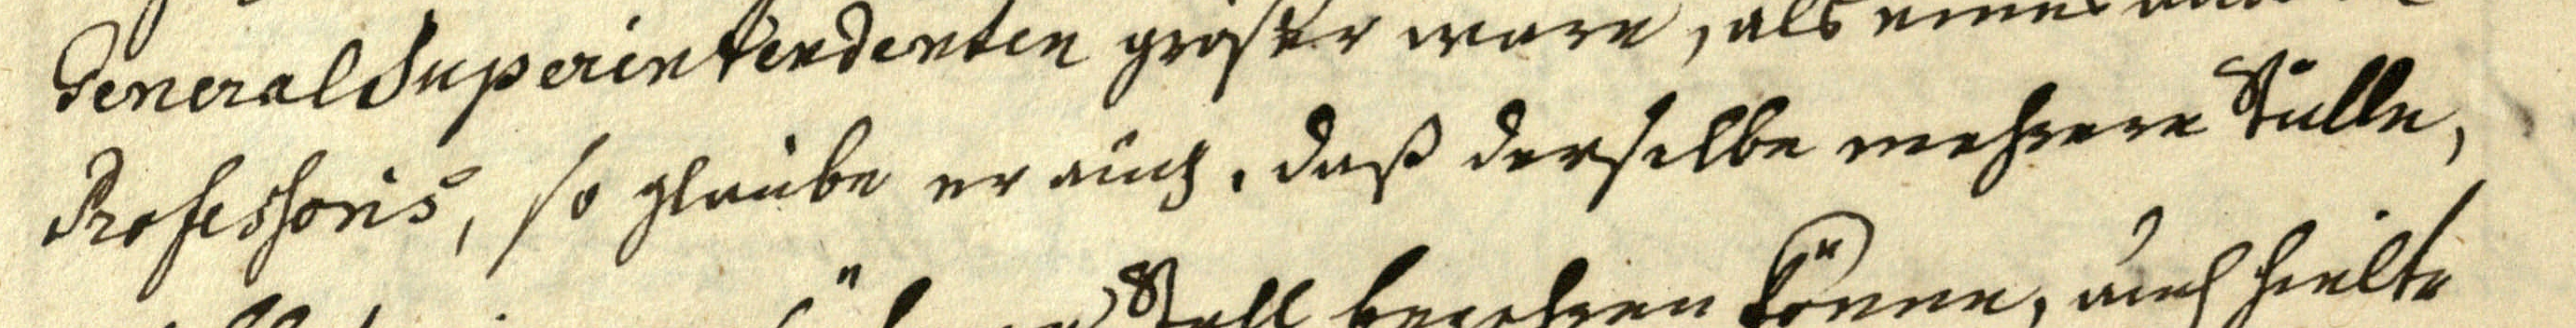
Professoris, so glaube er auch, daß derselbe mehrere Ställe,
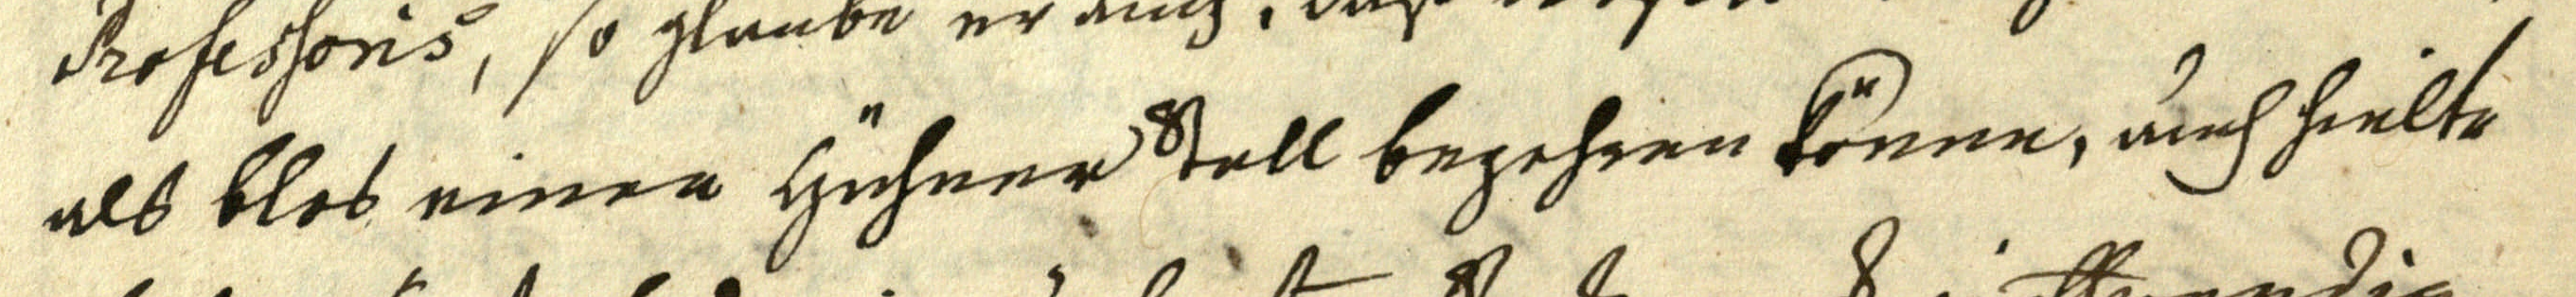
als blos einen Hühner Stall begehren könne, auch hielte
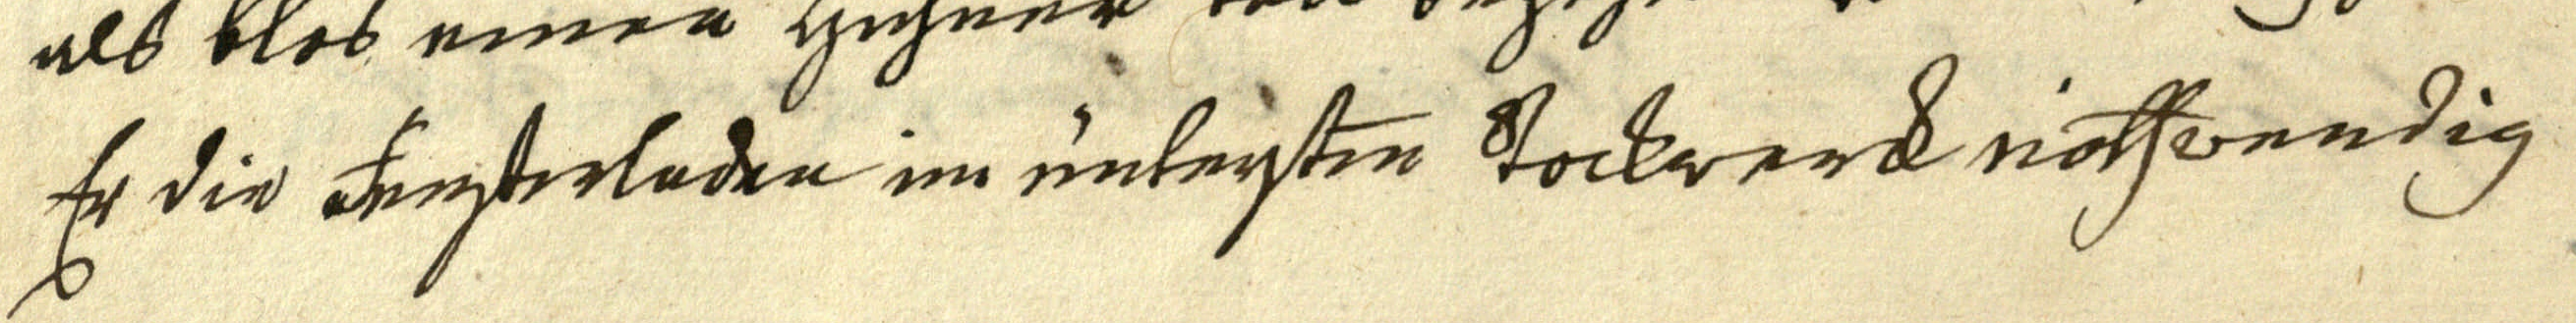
Er die Fensterladen im untersten Stockwerk nothwendig.
